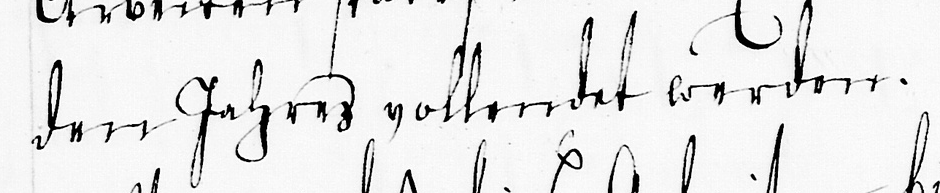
den Jahres vollendet werden.
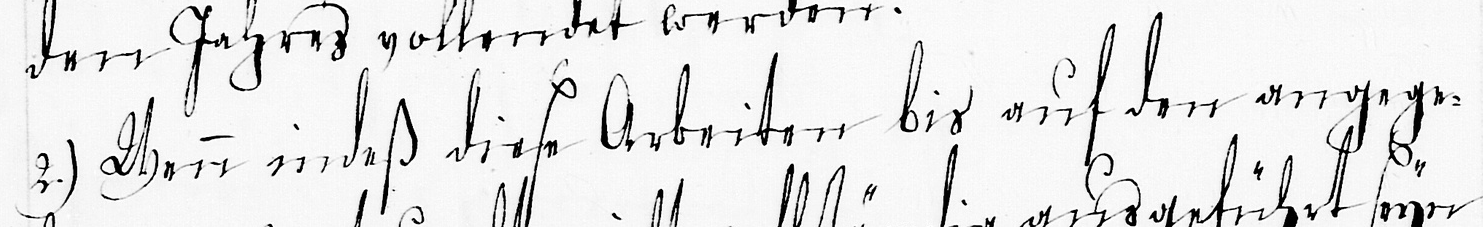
2.) Wenn indeß diese Arbeiten bis auf den angege¬
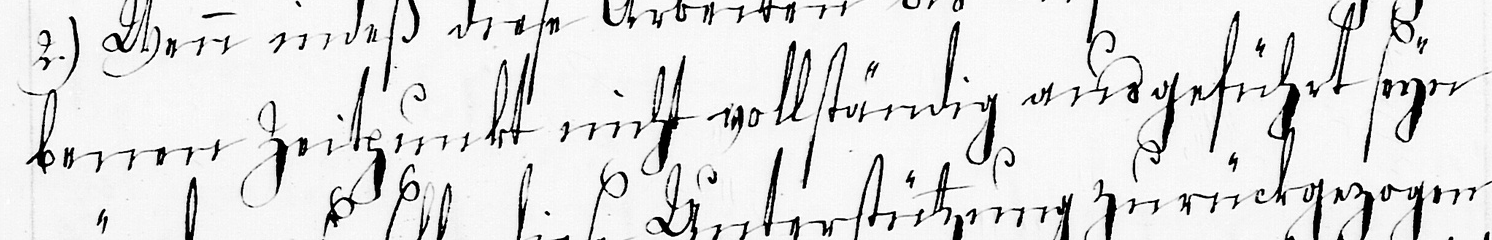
benen Zeitpunkt nicht vollständig ausgeführt seyn
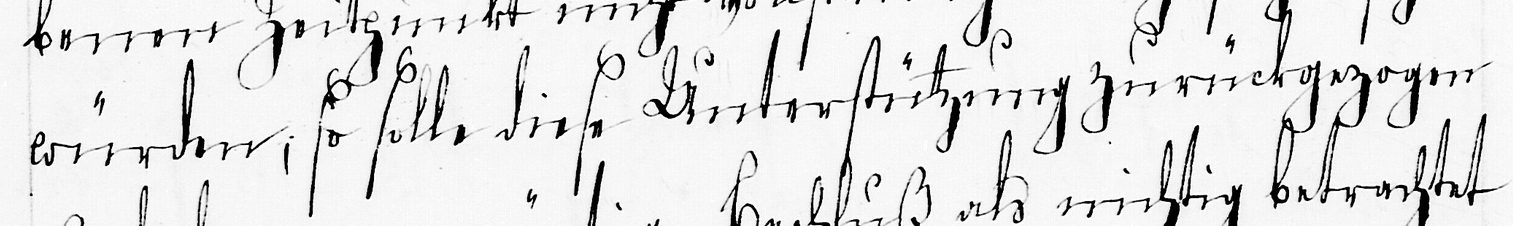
würden; so solle diese Unterstützung zurückgezogen
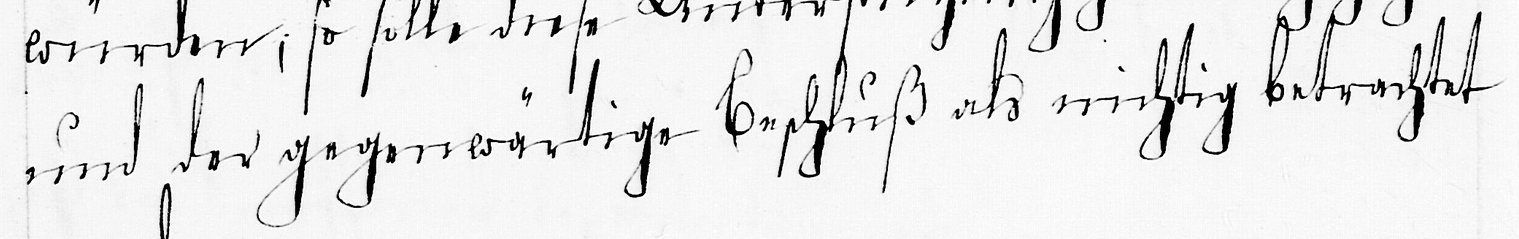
und der gegenwärtige Beschluß als nichtig betrachtet
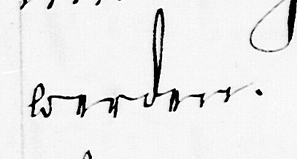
werden.
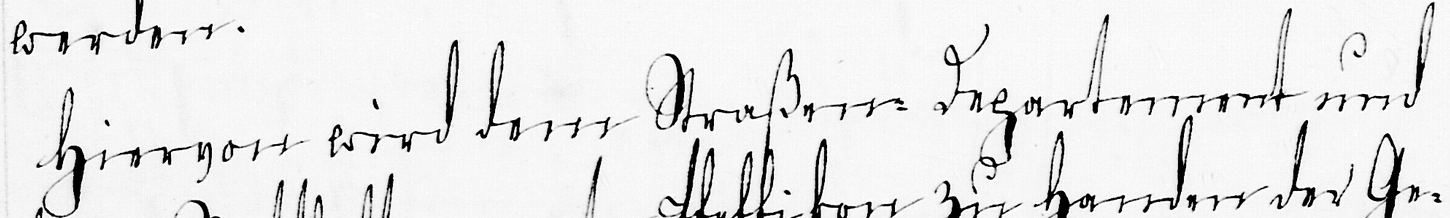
Hiervon wird dem Straßen-Departement und
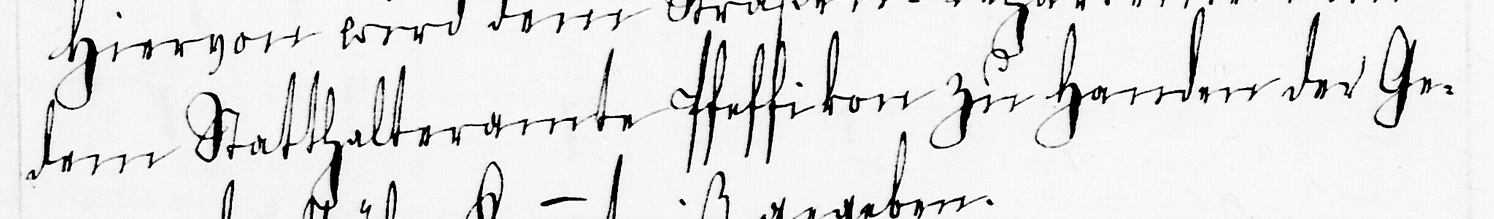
dem Statthalteramte Pfeffikon zu Handen der Ge¬
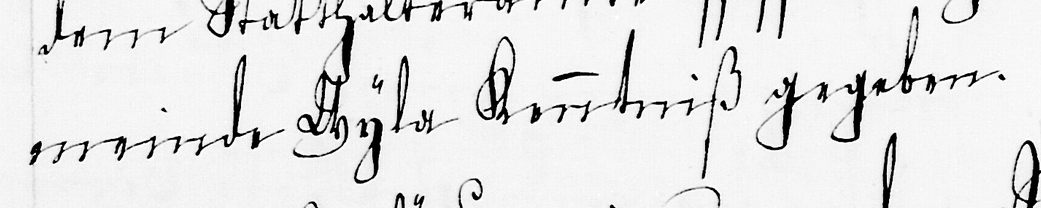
meinde Wyla Kenntniß gegeben.
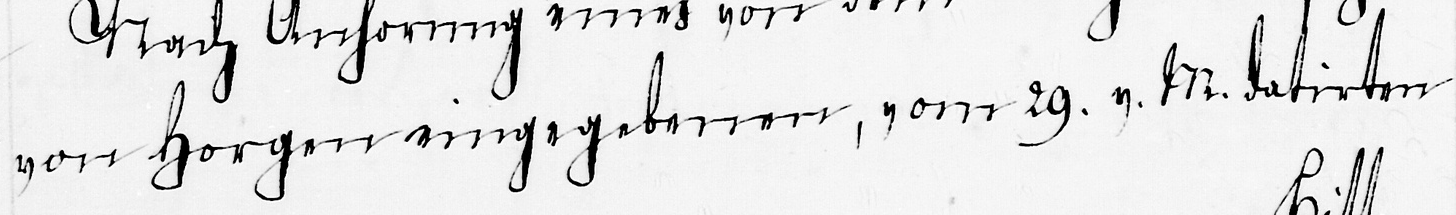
von Horgen eingegebenen, vom 29. v. M. datirten
